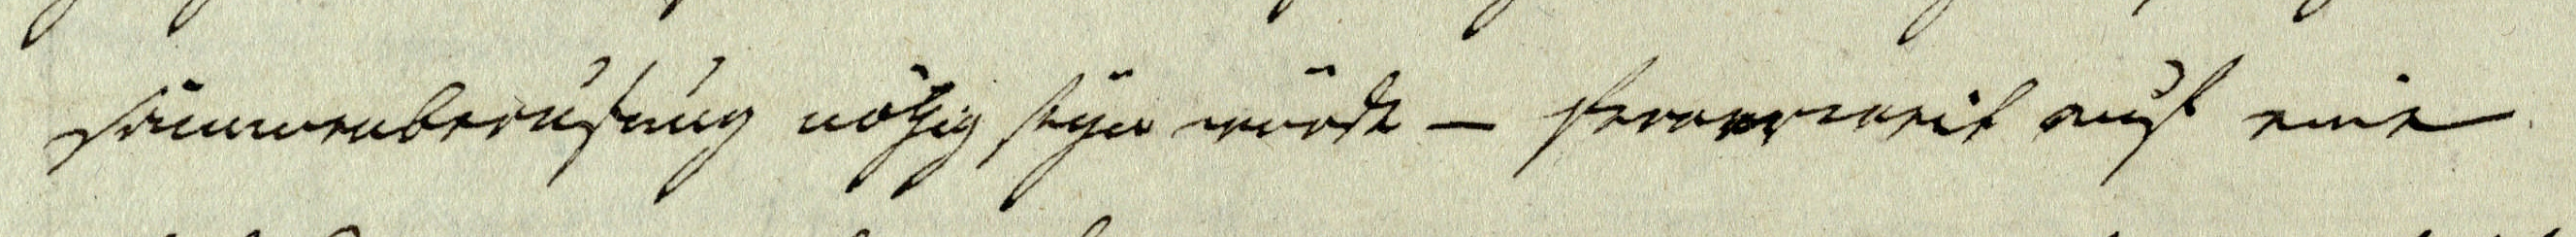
sammenberufung nöthig seÿn würde fernerweit auf eine
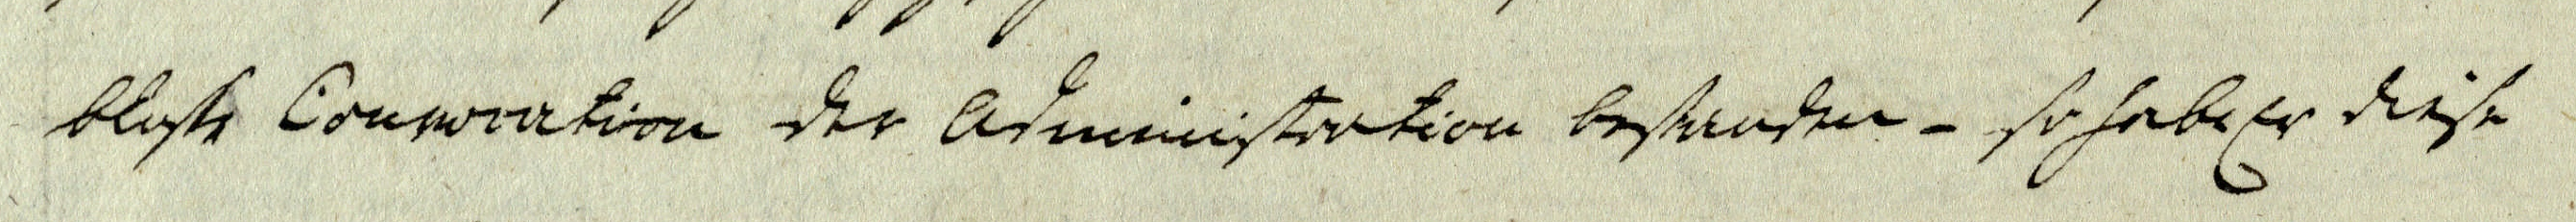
blosse Convocation der Administration bestanden so habe Er diese
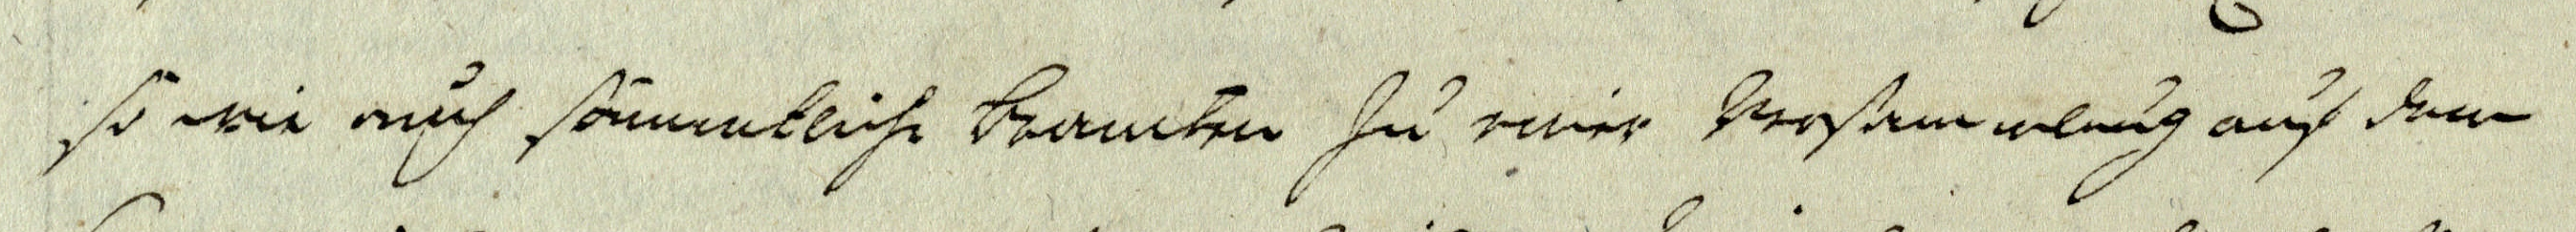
so wie auch sämmtliche Beamten zu einer Versammlung auf dem
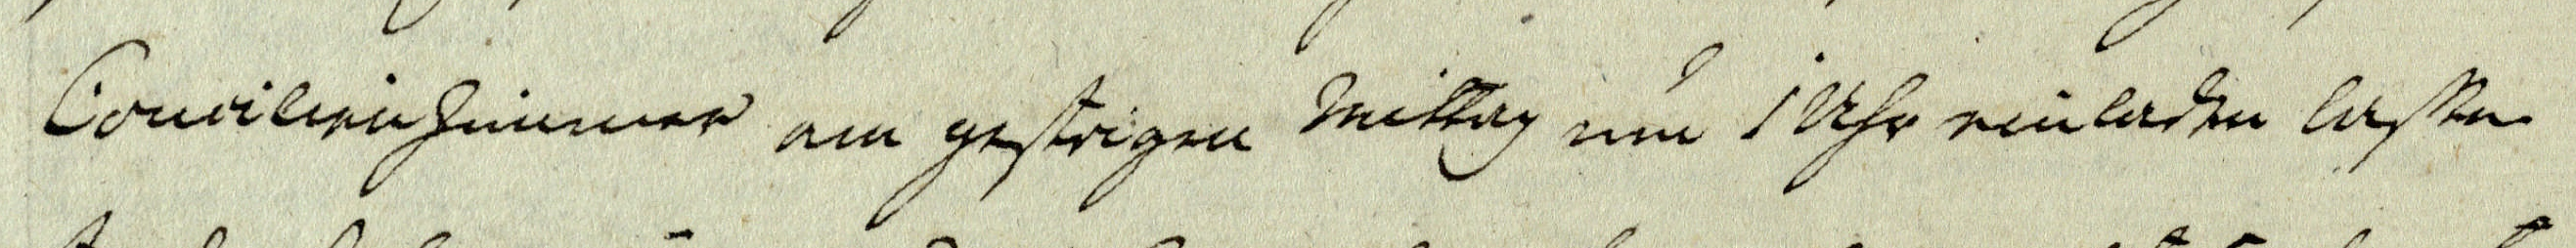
Concilienzimmer am gestrigen Mittag um 1 Uhr einladen lassen.
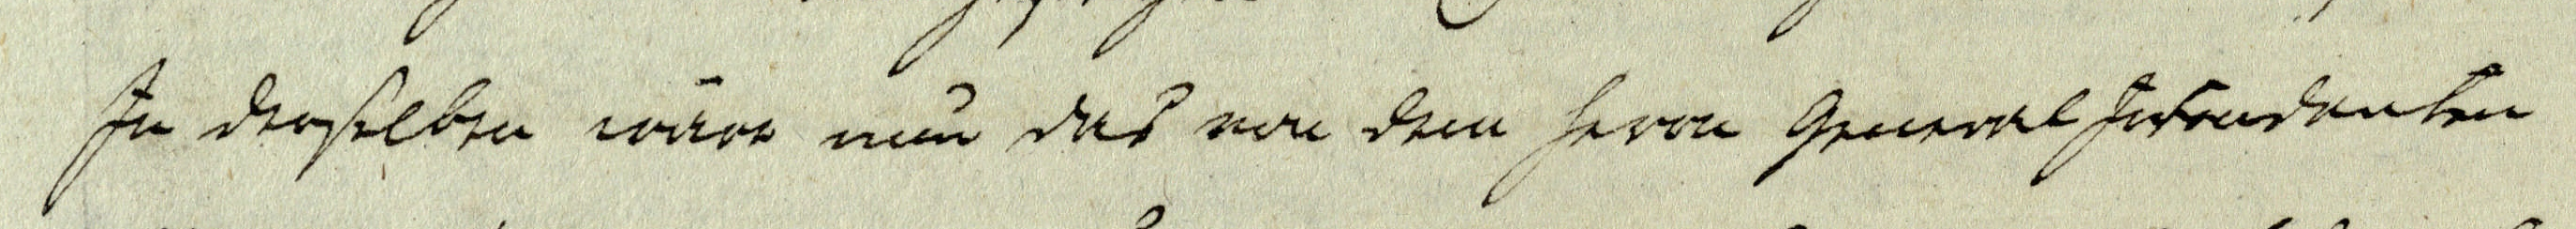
In derselben wäre nun das von dem Herrn Generalintendanten
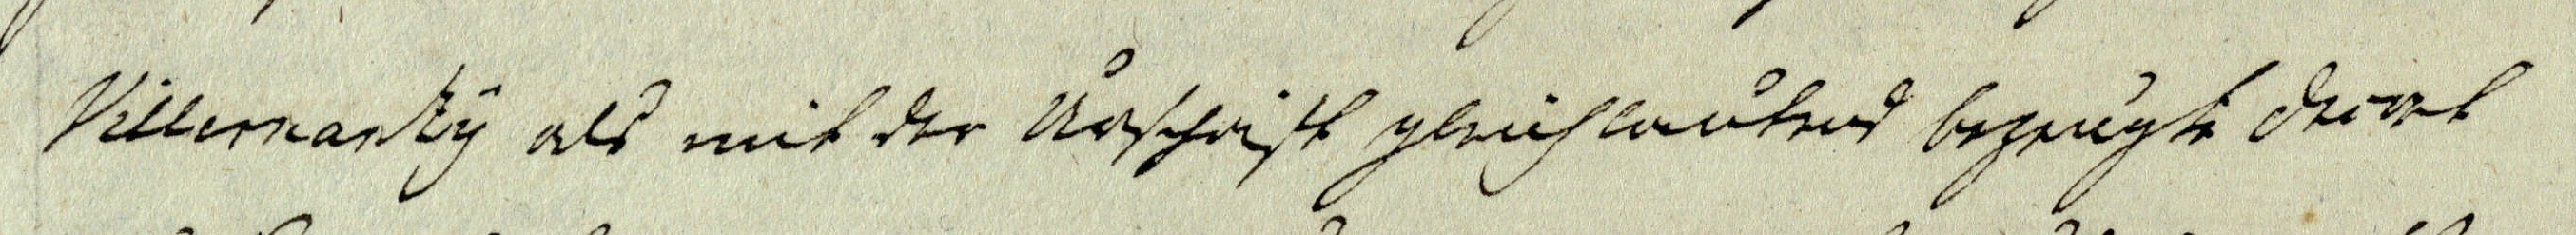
Villemanzÿ als mit der Urschrift gleichlautend bezeugte decret
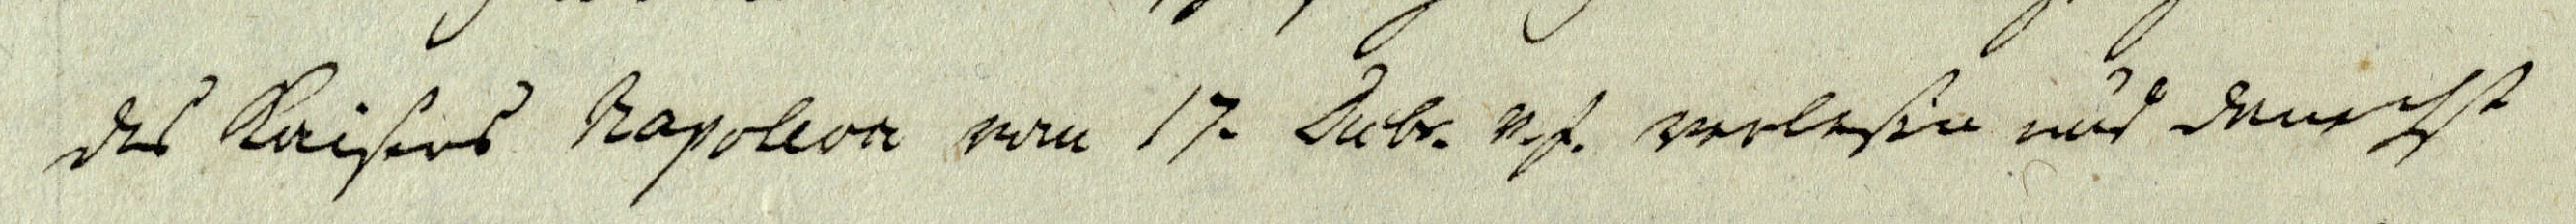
des Kaisers Napoleon vom 17. Decbr. v. J. verlesen und danechst
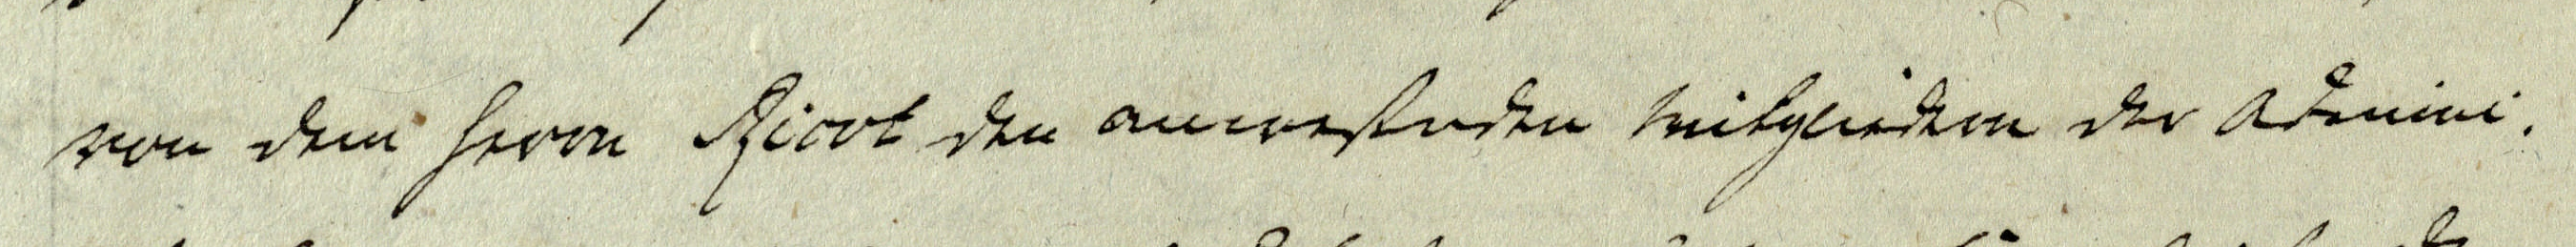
von dem Herrn Ricot den anwesenden Mitgliedern der Admini¬
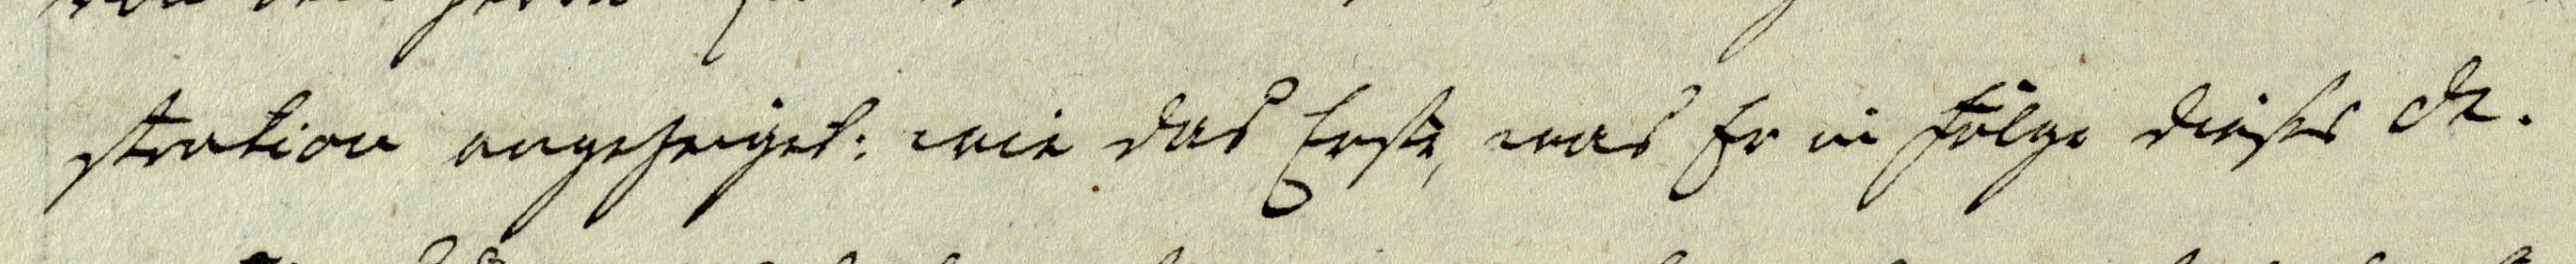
stration angezeiget: wie das Erste, was Er in Folge dieses de¬
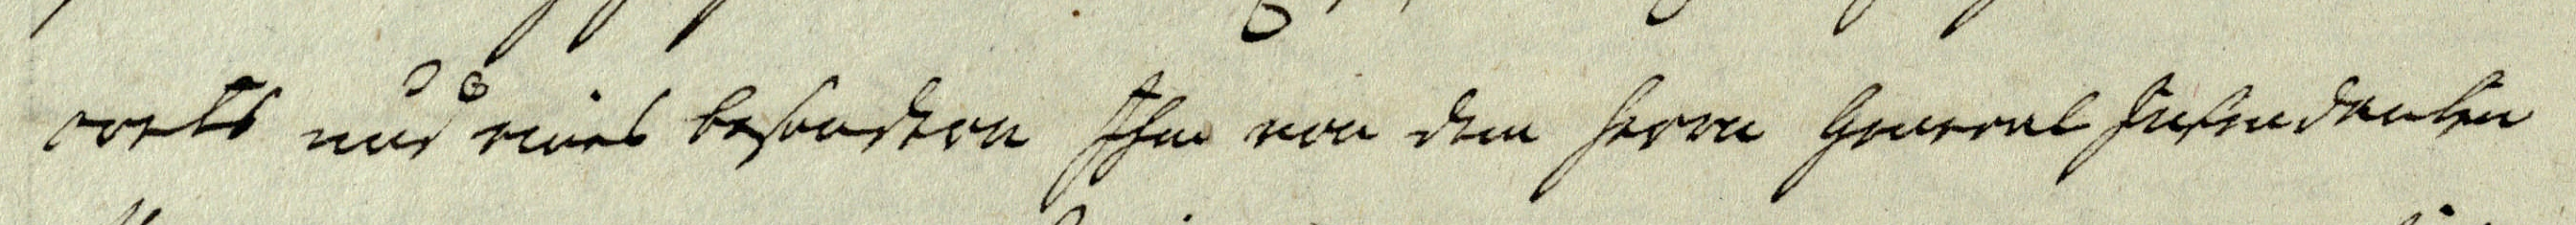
crets und eines besondern Ihm von dem Herrn GeneralIntendanten
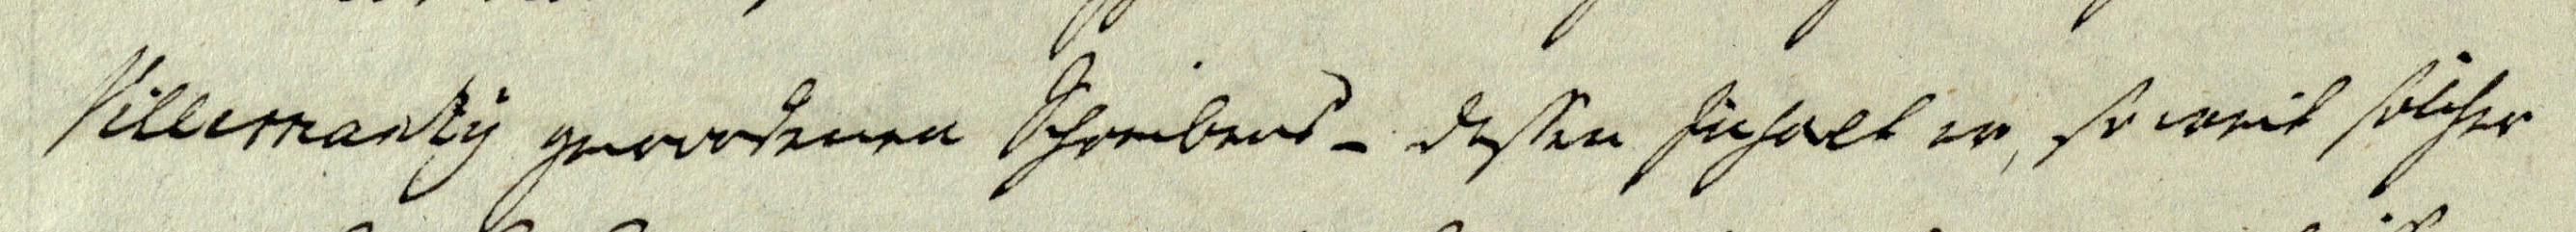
Villemanzÿ gewordenen Schreibens dessen Inhalt er, so weit solcher
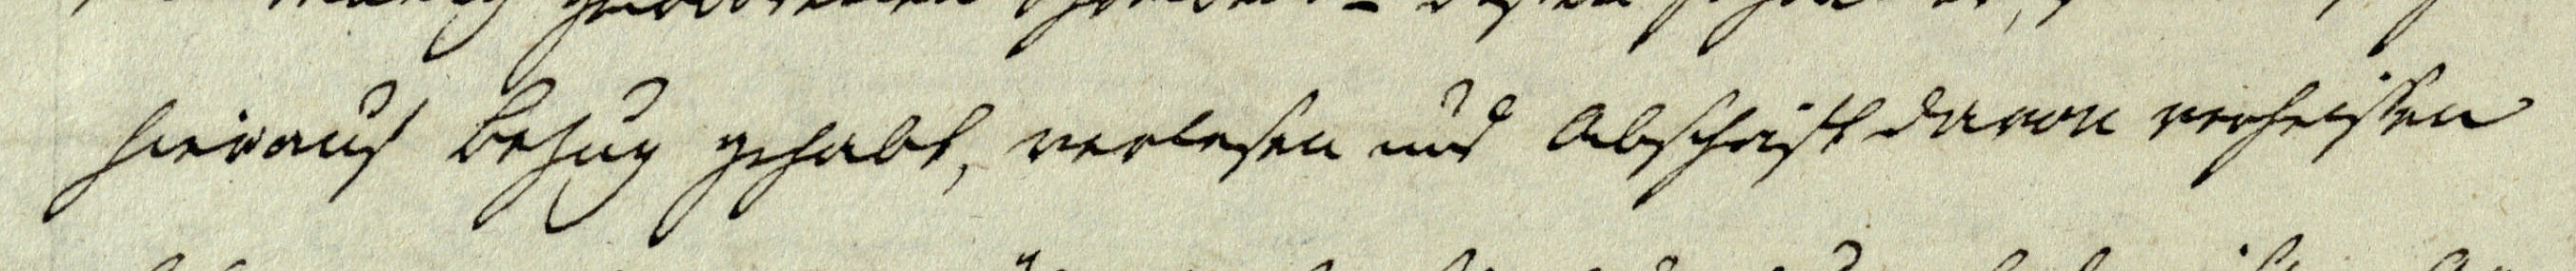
hierauf Bezug gehabt, verlesen und Abschrift davon verheissen
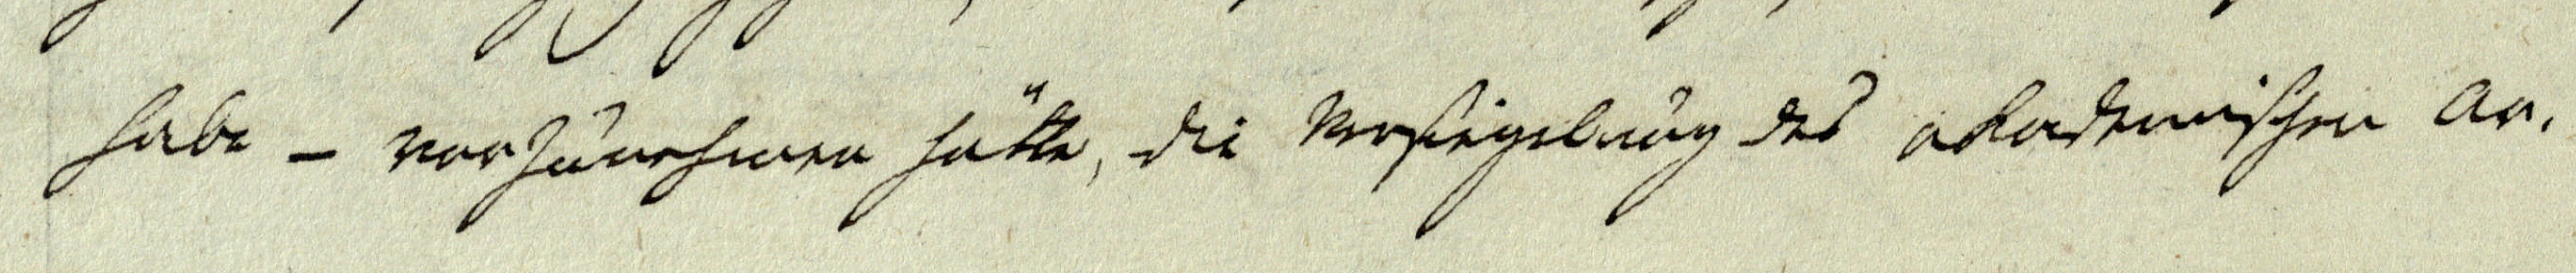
habe vorzunehmen hätte, die Versiegelung des akademischen Ar¬
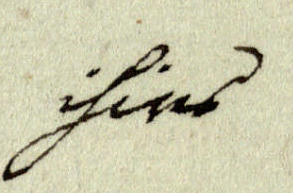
chivs
